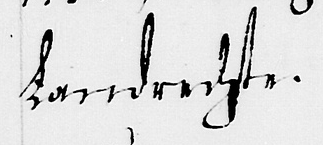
Landrechte.
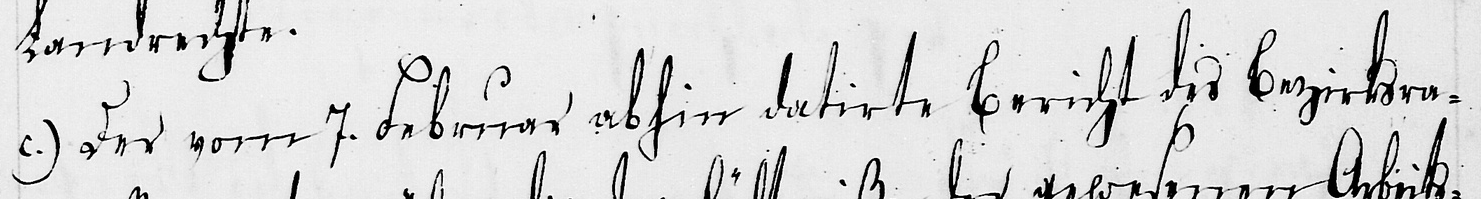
c.) Der vom 7. Februar abhin datirte Bericht des Bezirksra¬
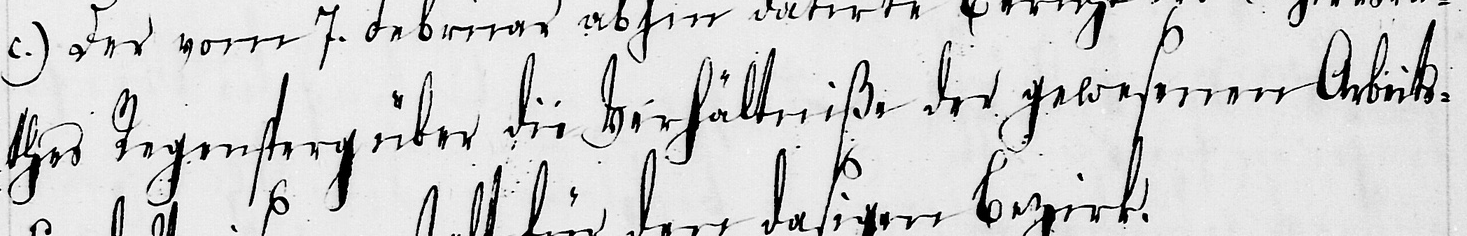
thes Regensberg über die Verhältniße der gewesenen Arbeits-
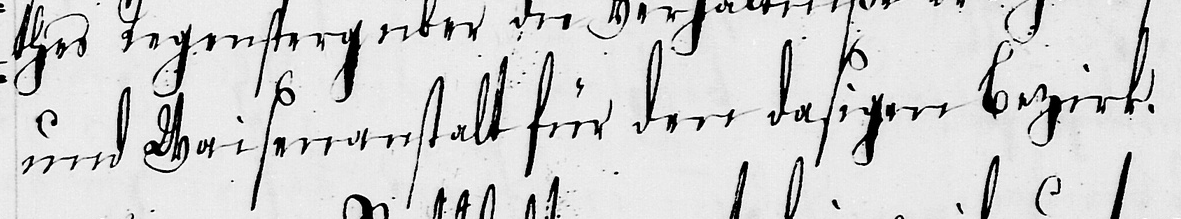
und Waisenanstalt für den dasigen Bezirk.
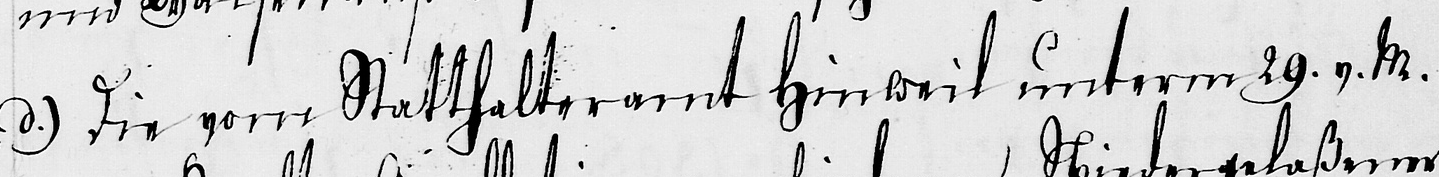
d.) Die vom Statthalteramt Hinweil unterm 29. v. M.
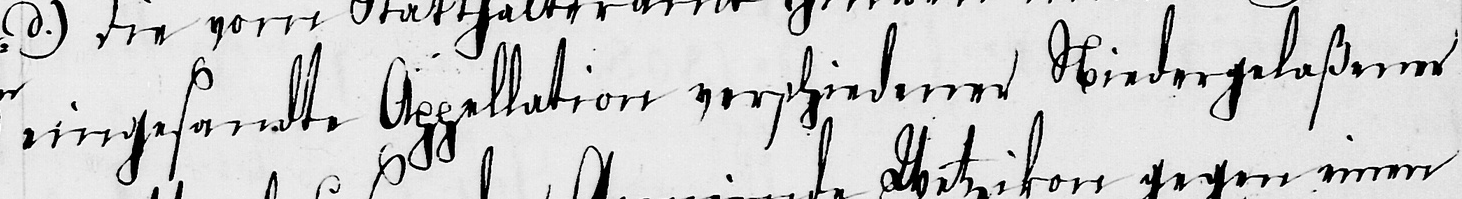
eingesandte Appellation verschiedener Niedergelaßener
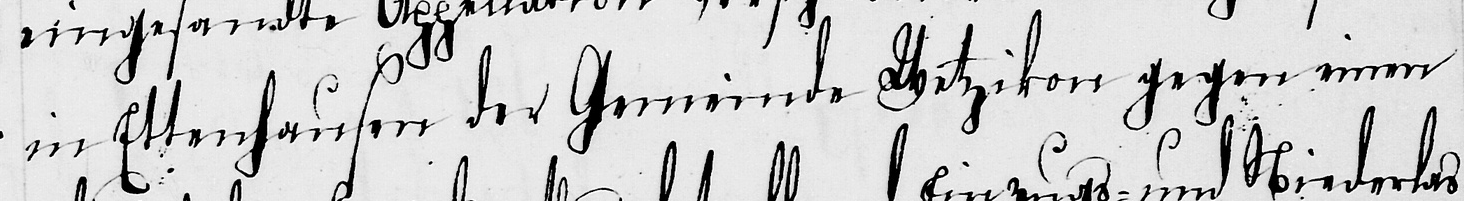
in Ettenhausen der Gemeinde Wetzikon gegen einen
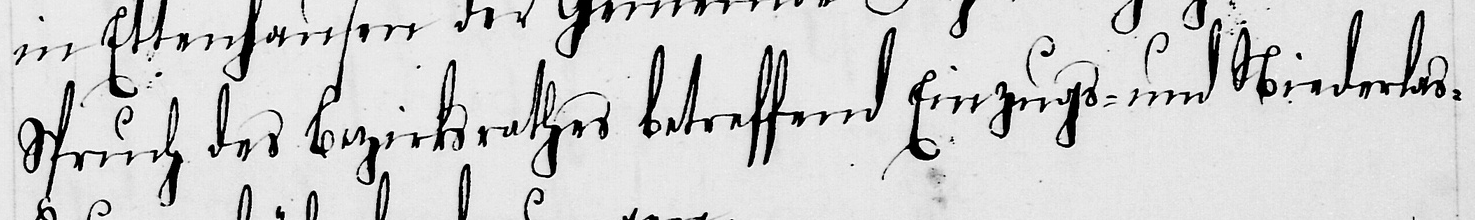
Spruch des Bezirksrathes betreffend Einzugs- und Niederlas¬
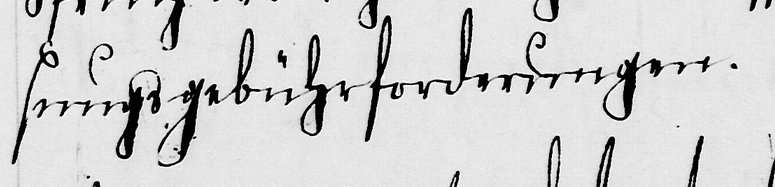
sungsgebührforderungen.
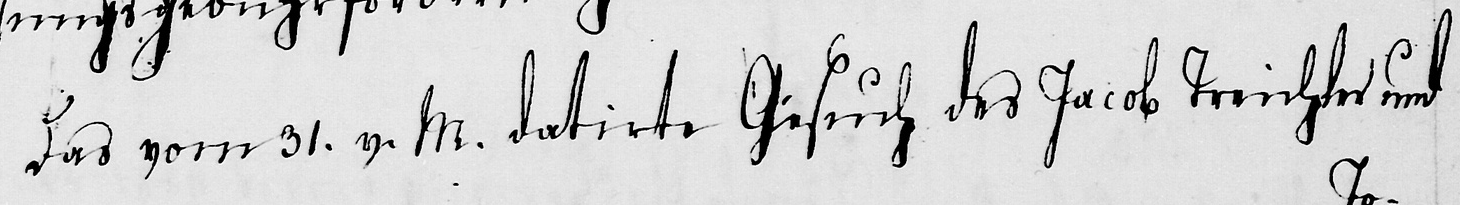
Das vom 31. v. M. datirte Gesuch des Jacob Treichler und
